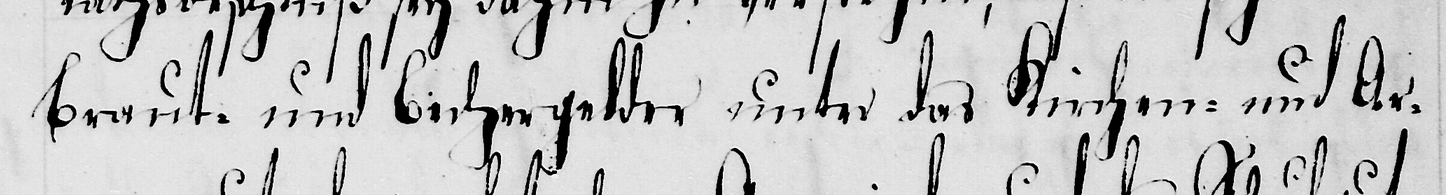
Braut- und Bechergelder unter das Kirchen- und Ar¬
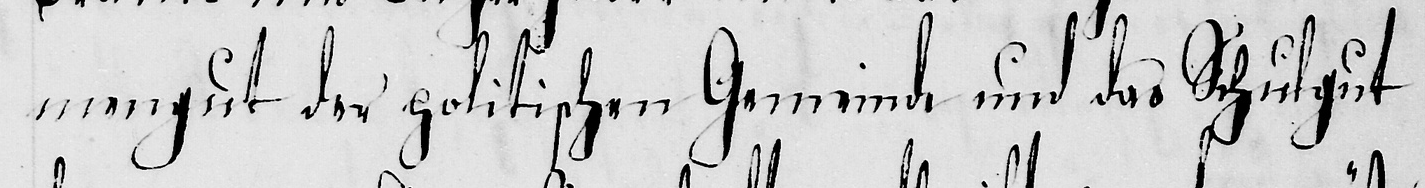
mengut der politischen Gemeinde und das Schulgut
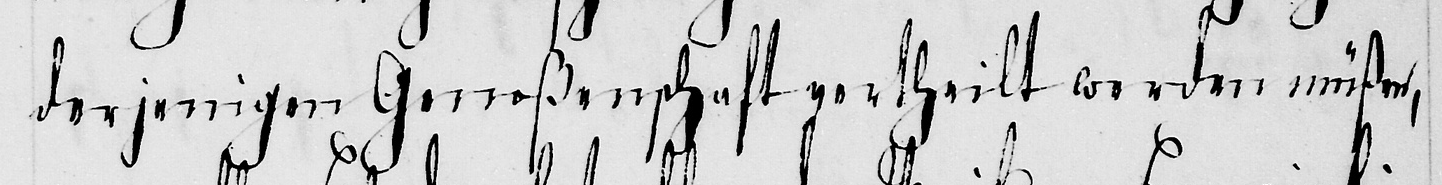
derjenigen Genoßenschaft vertheilt werden müßen,
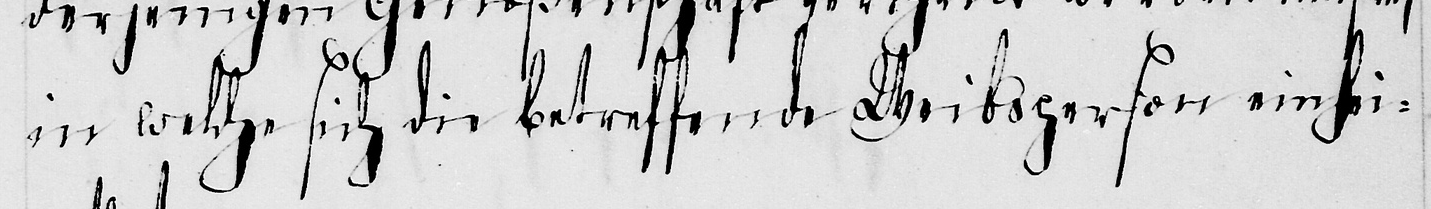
in welche sich die betreffende Weibsperson einhei¬
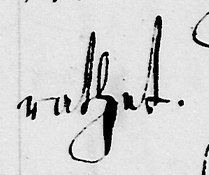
rathet.
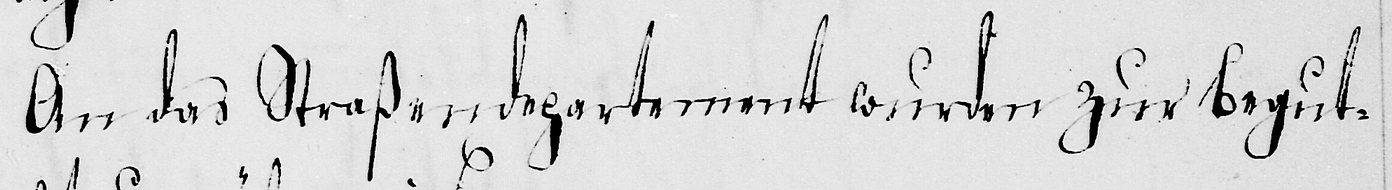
An das Straßendepartement wurden zur Begut¬
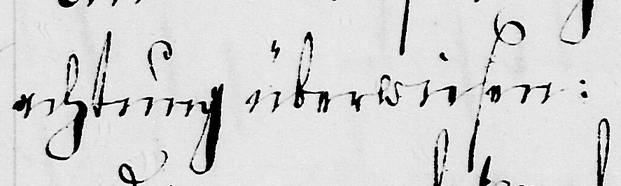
achtung überwiesen:
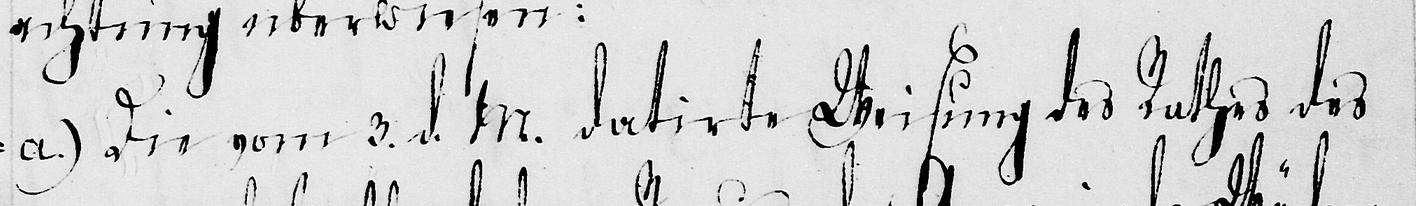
a.) Die vom 3. d. M. datirte Weisung des Rathes des
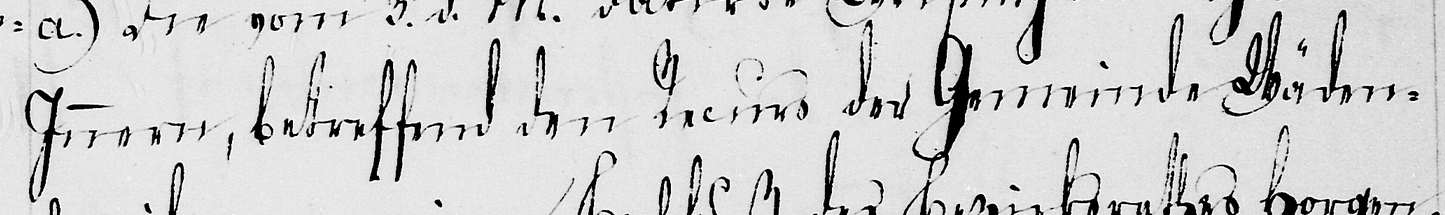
Innern, betreffend den Recurs der Gemeinde Wäden¬
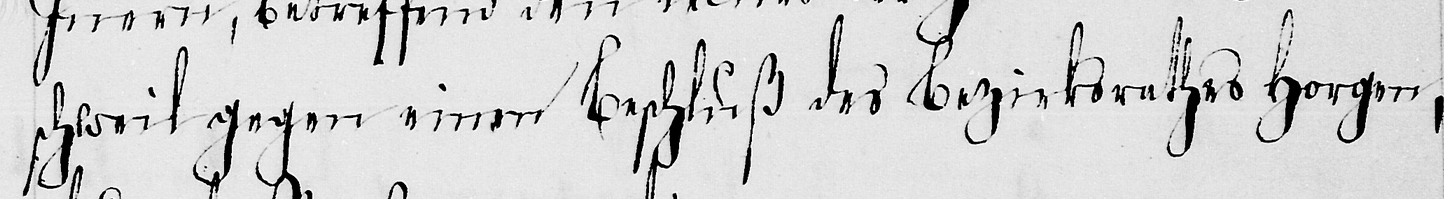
schweil gegen einen Beschluß des Bezirksrathes Horgen,
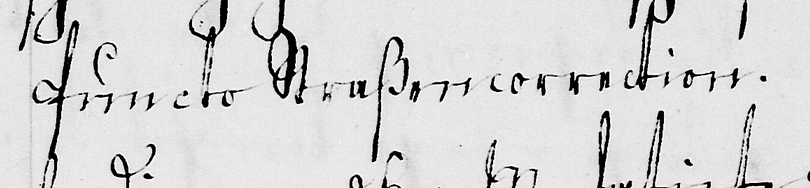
Puncto Straßencorrection.
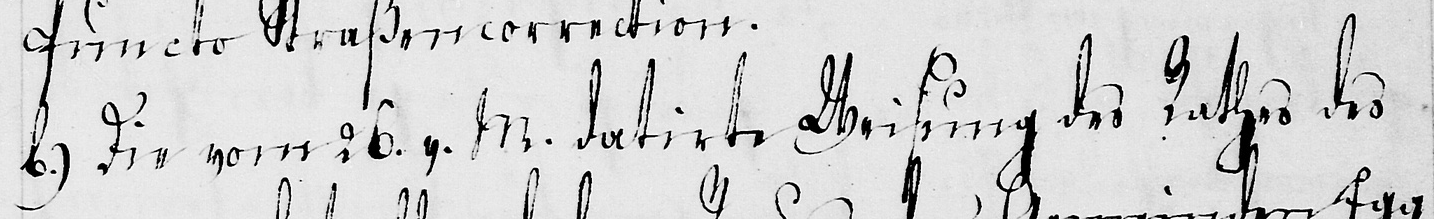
b.) Die vom 26. v. M. datirte Weisung des Rathes des
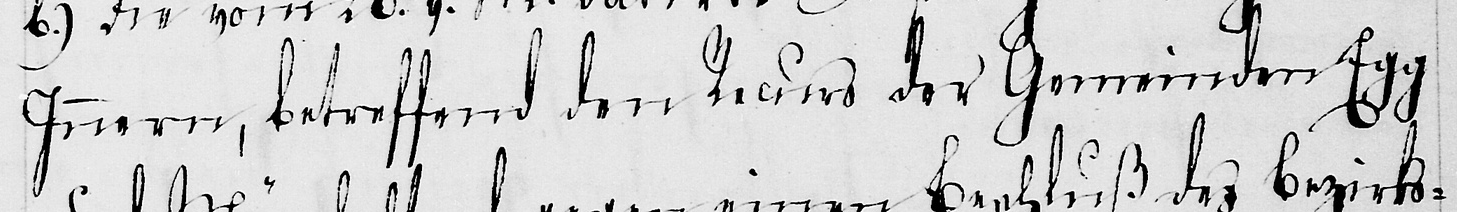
Innern, betreffend den Recurs der Gemeinden Egg
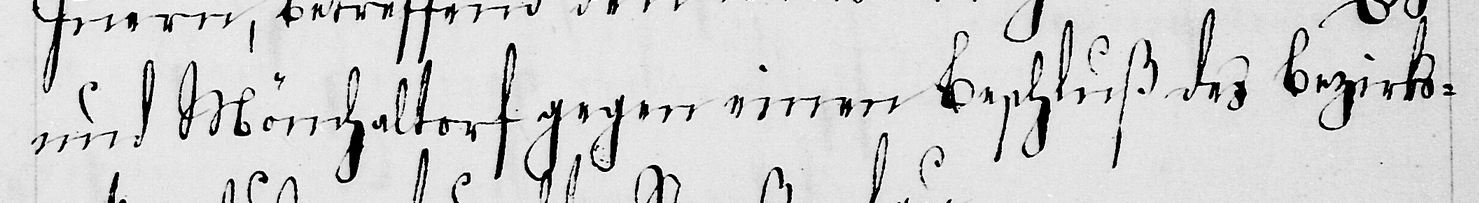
und Mönchaltorf gegen einen Beschluß des Bezirks¬
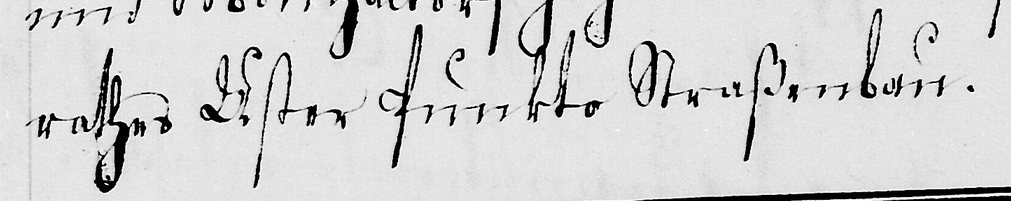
rathes Uster Punkto Straßenbau.
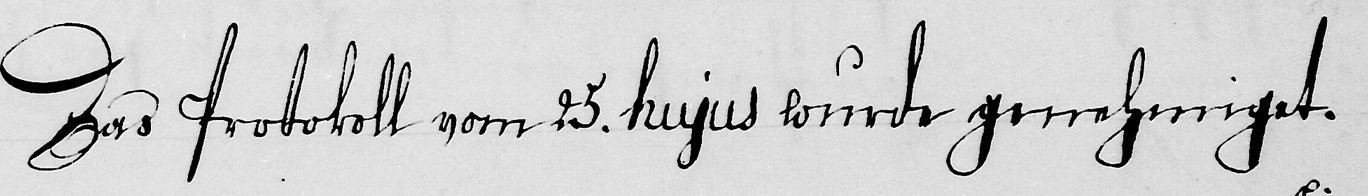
Das Protokoll vom 25. hujus wurde genehmiget.
